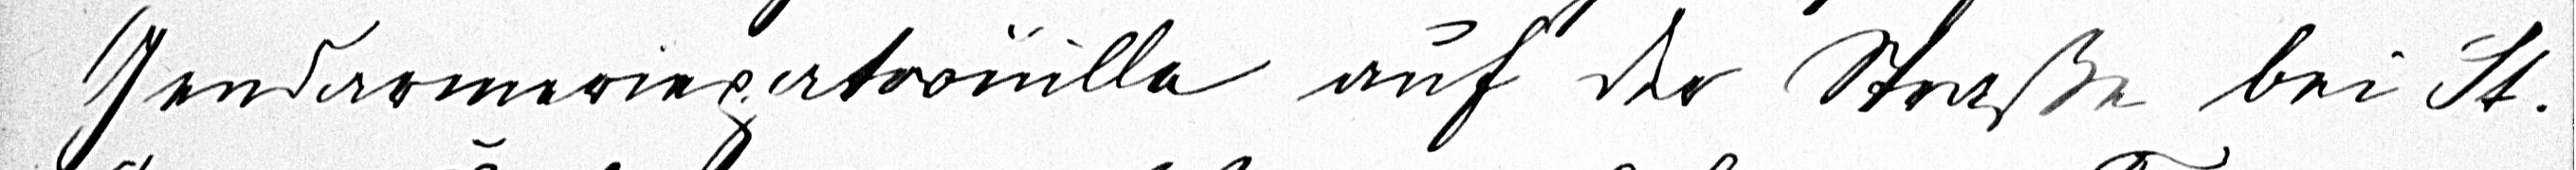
Gendarmeriepatrouille auf der Straße bei St.
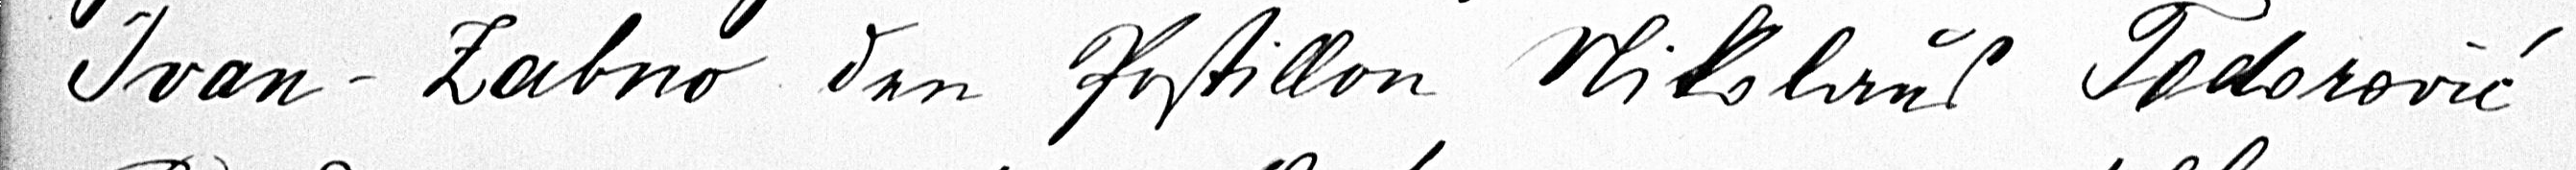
Ivan - Žabno den Postillon Nikolaus Todorović
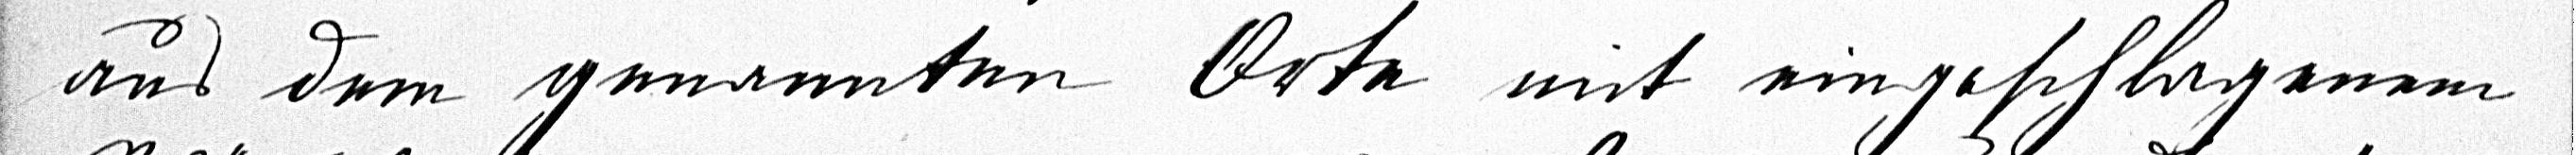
aus dem genannten Orte mit eingeschlagenem
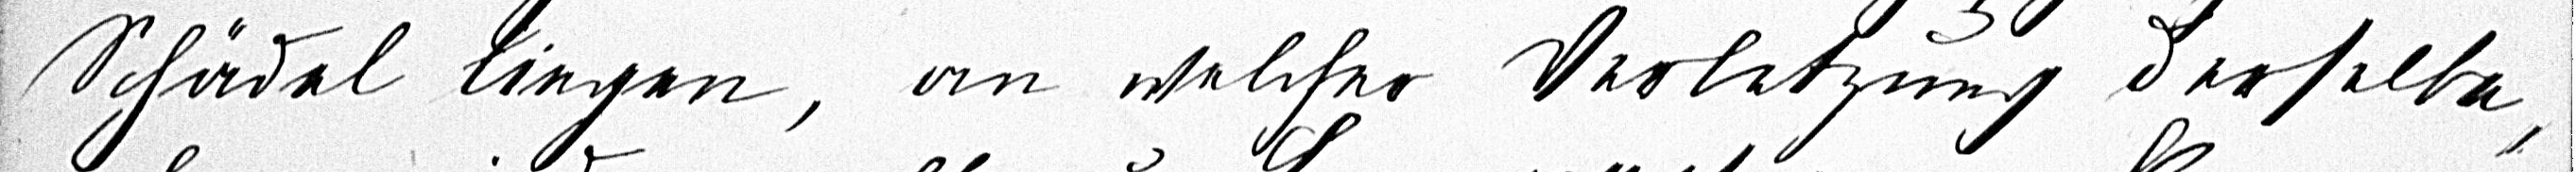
Schädel liegen, an welcher Verletzung derselbe,
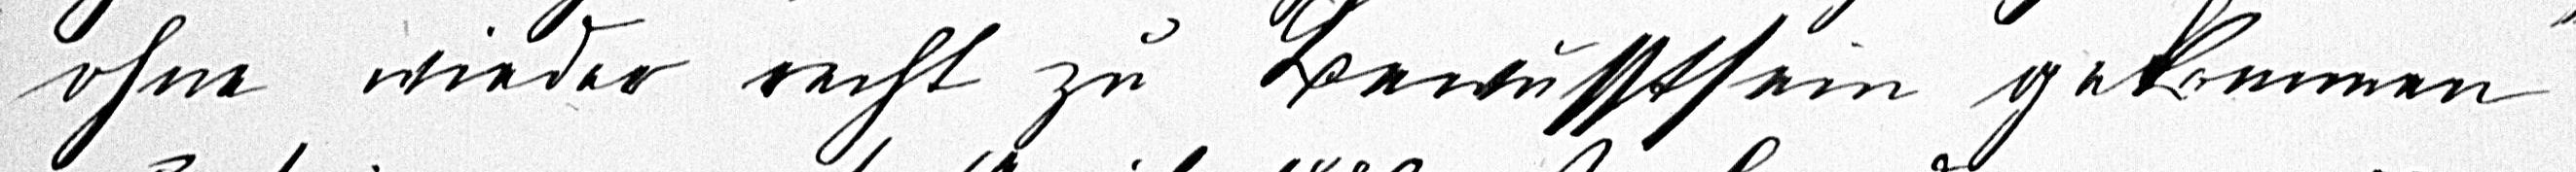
ohne wieder recht zu Bewusstsein gekommen
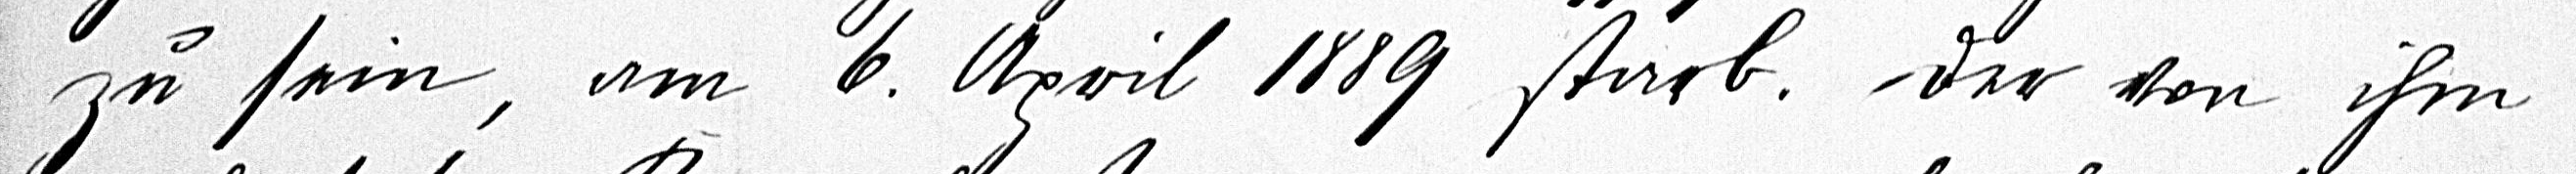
zu sein, am 6. April 1889 starb. der von ihm
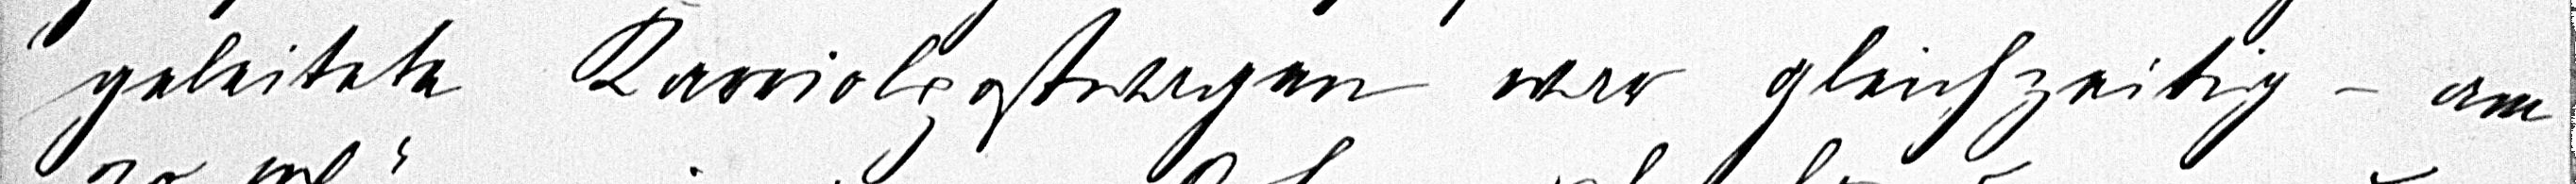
geleitete Karriolpostwagen war gleichzeitig - am
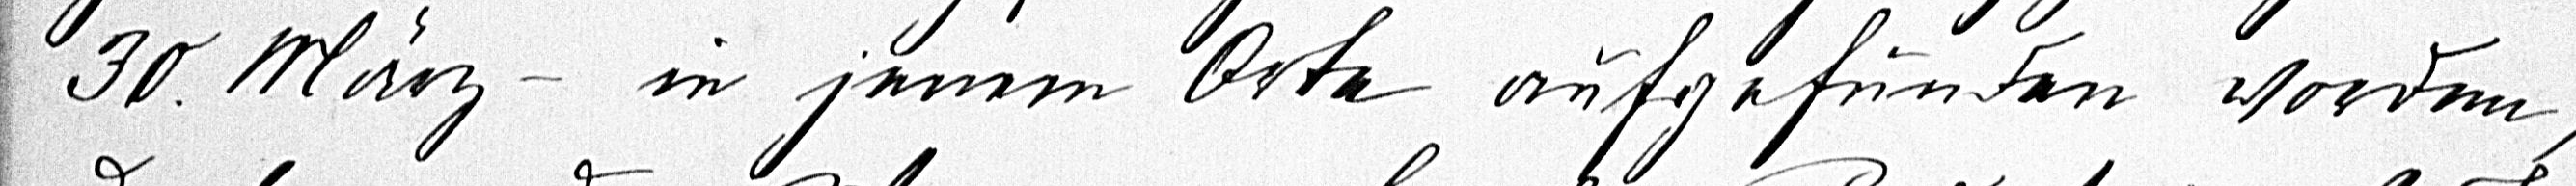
30. März - in jenem Orte aufgefunden worden,
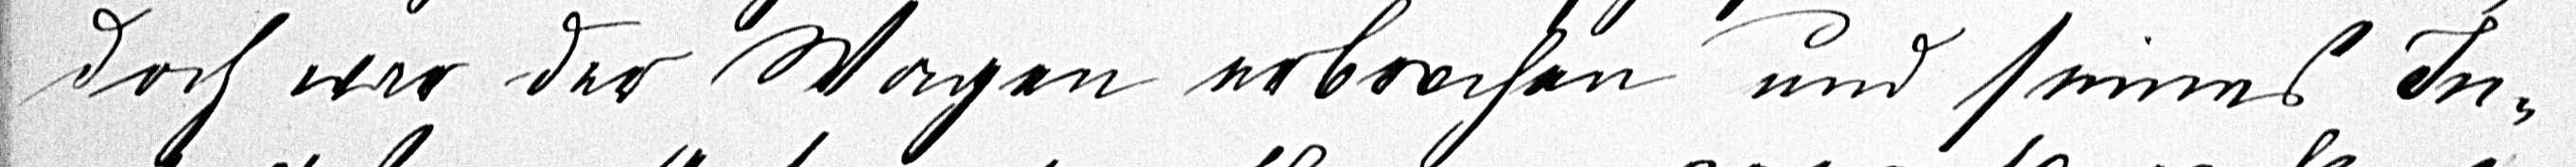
doch war der Wagen erbrochen und seines In¬
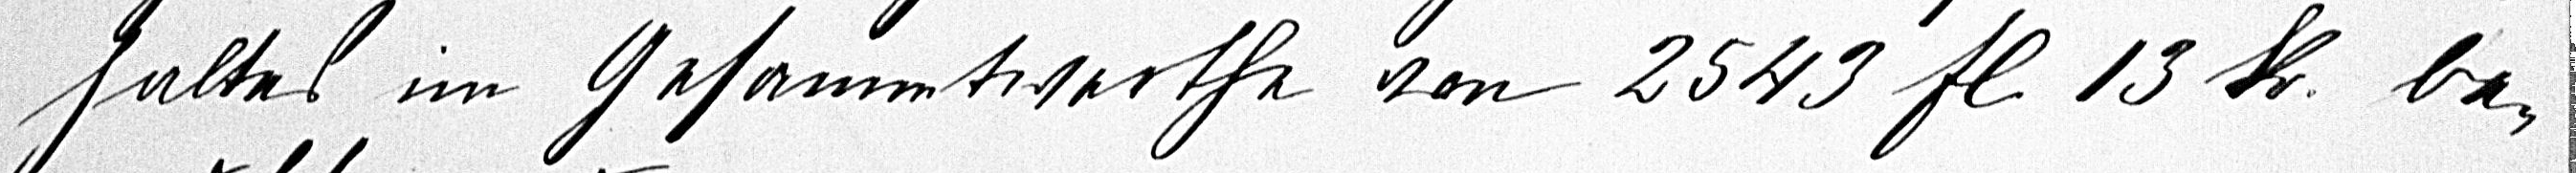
haltes im Gesammtwerthe von 2543 fl. 13 kr. be¬
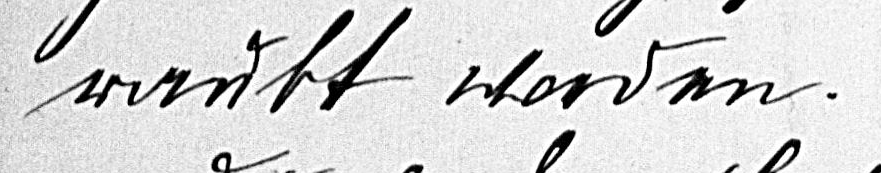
raubt werden.
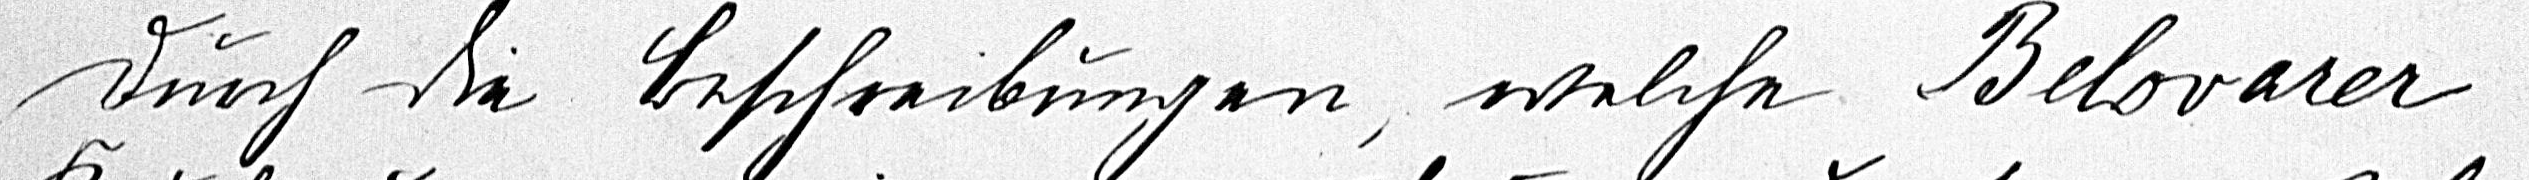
Durch die Beschreibungen, welche Belovarer
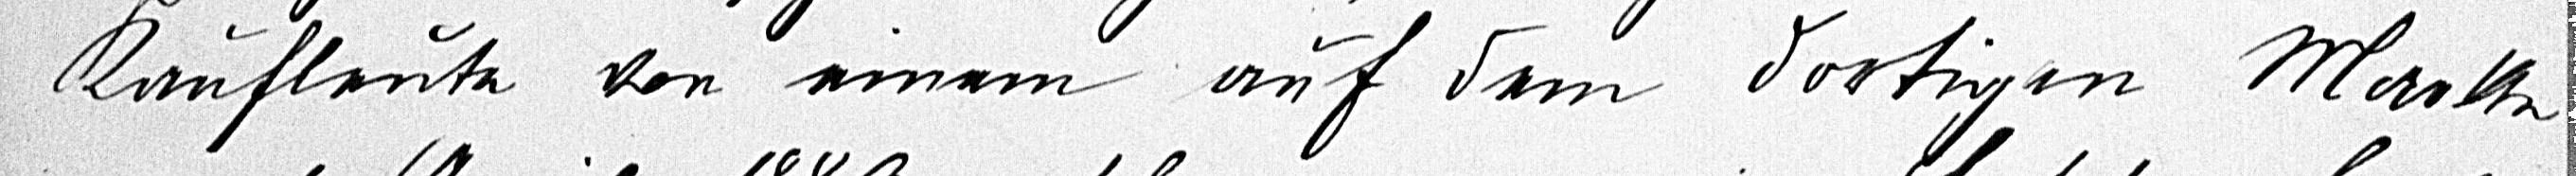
Kaufleute von einem auf dem dortigen Marke
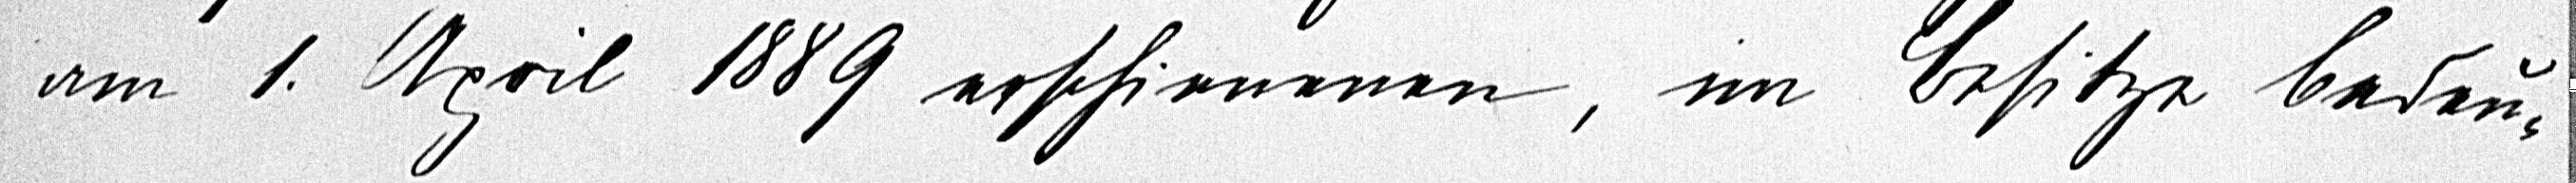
am 1. April 1889 erschienenen, im Besitze bedeu-
